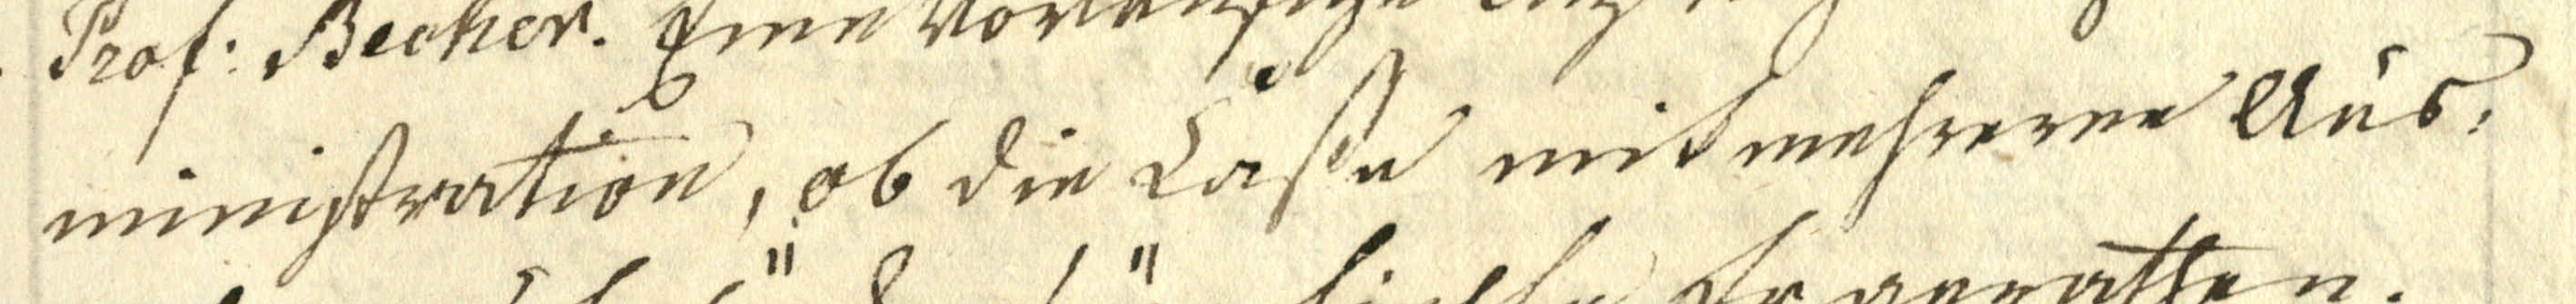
ministration, ob die Casse mit mehreren Aus¬
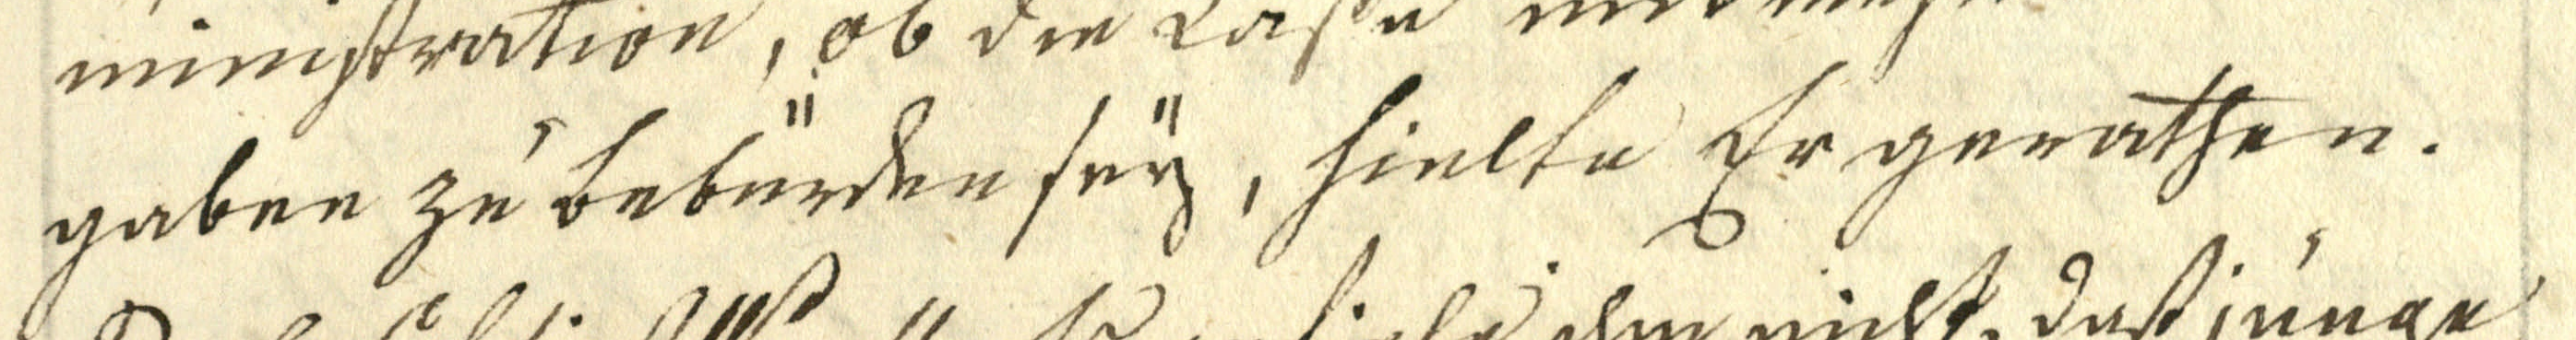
gaben zu bebürden seÿ, hielte Er gerathen.
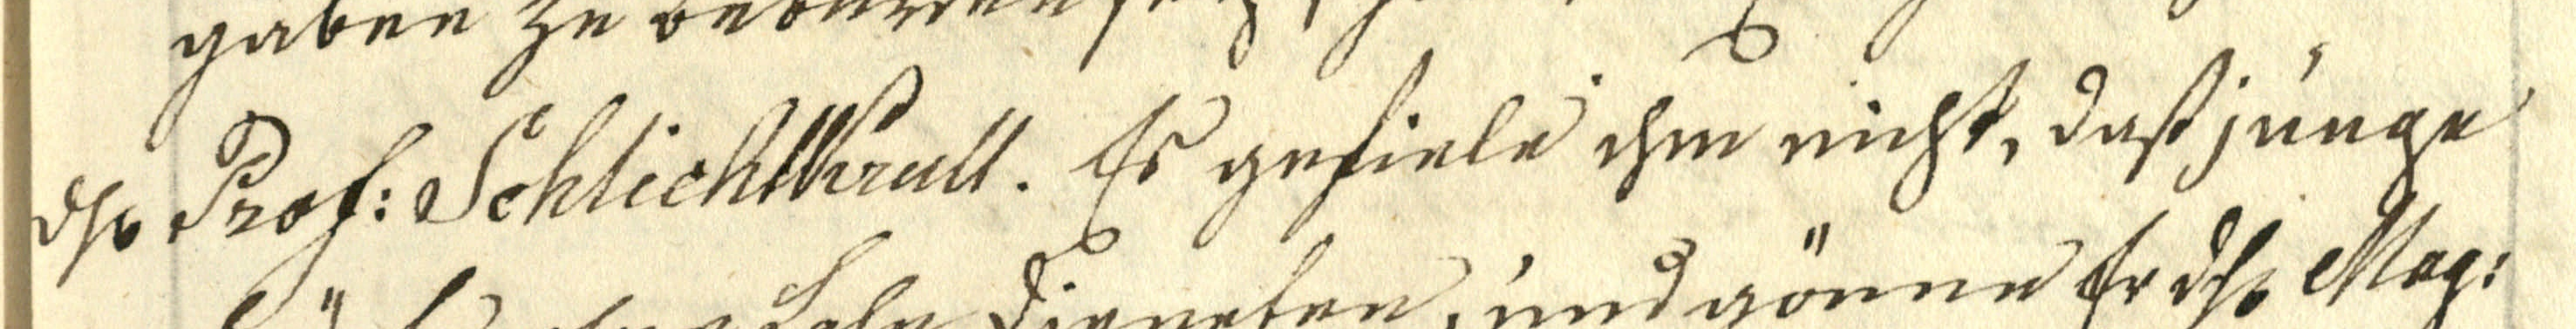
dh Prof. Schlichtkrull. Es gefiele ihm nicht, das junge
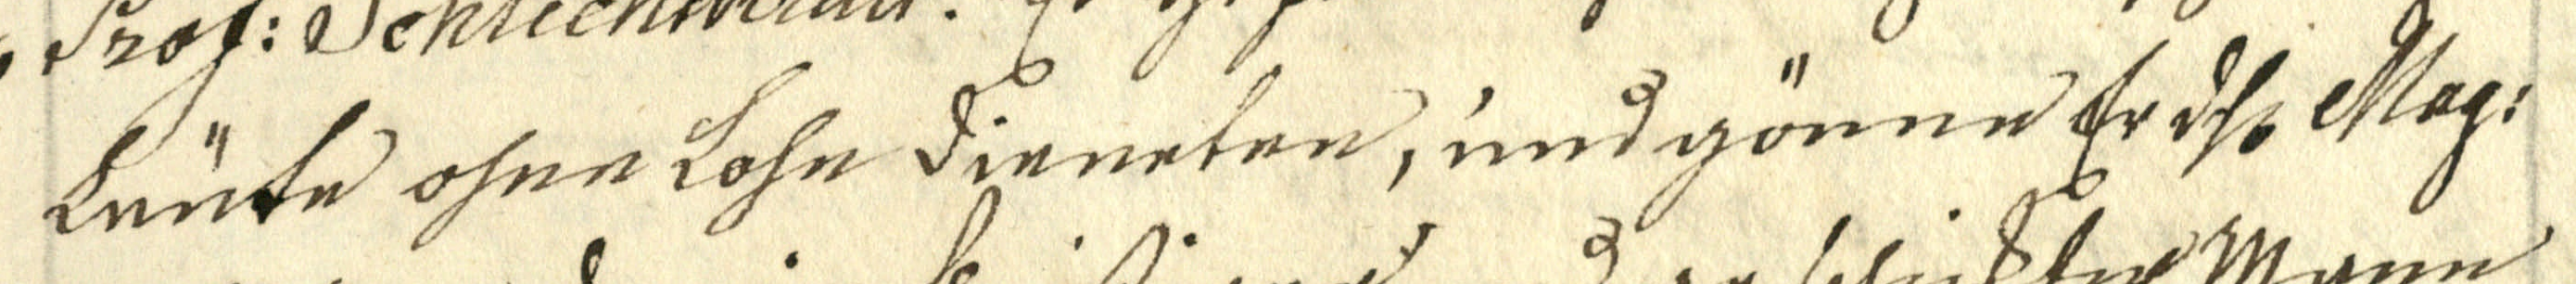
Baute ohne Lohn dieneten, und gönne Er dh. Mag.
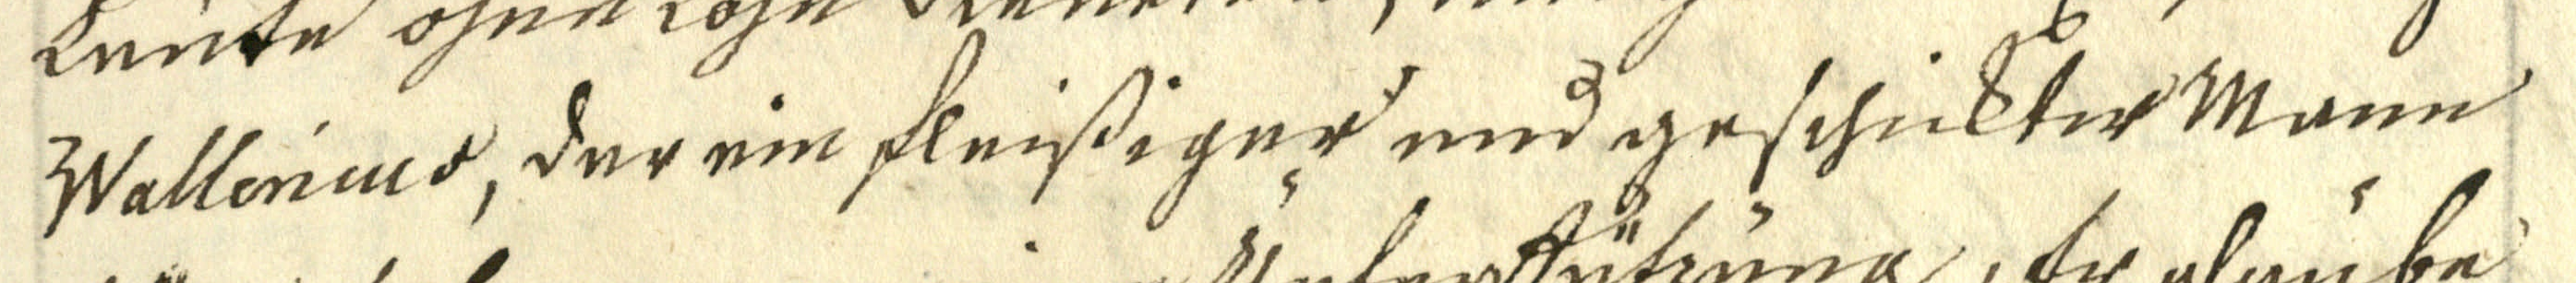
Wallenius, der ein fleißiger und geschickter Mann
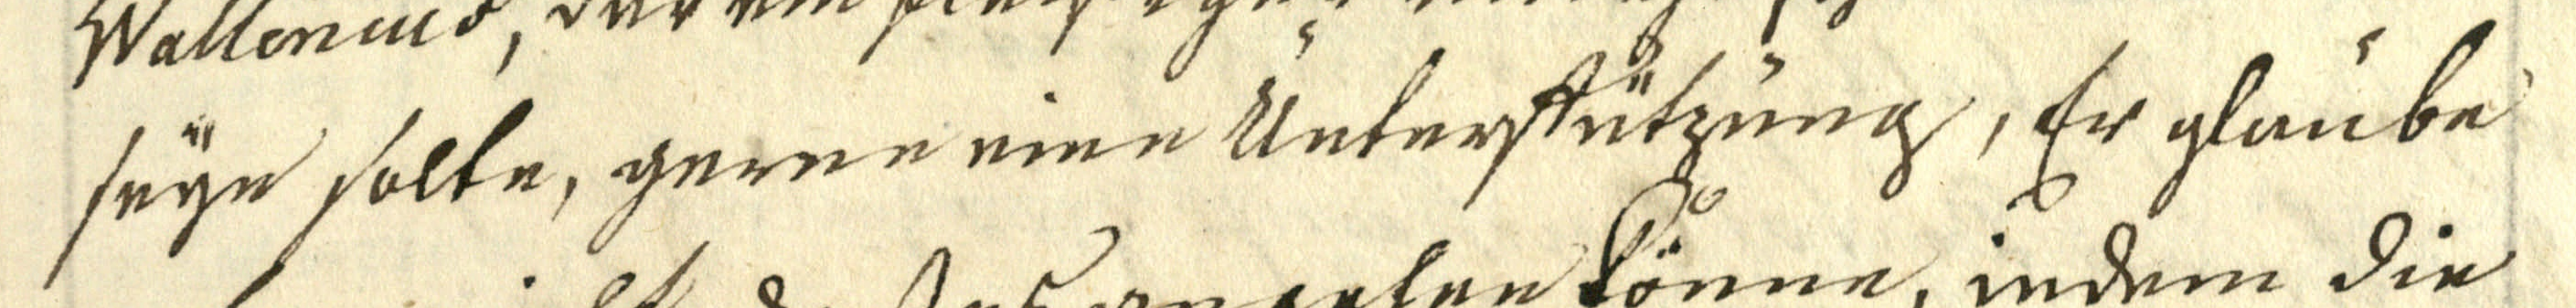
seÿn solte, gerne eine Unterstützung, Er glaube
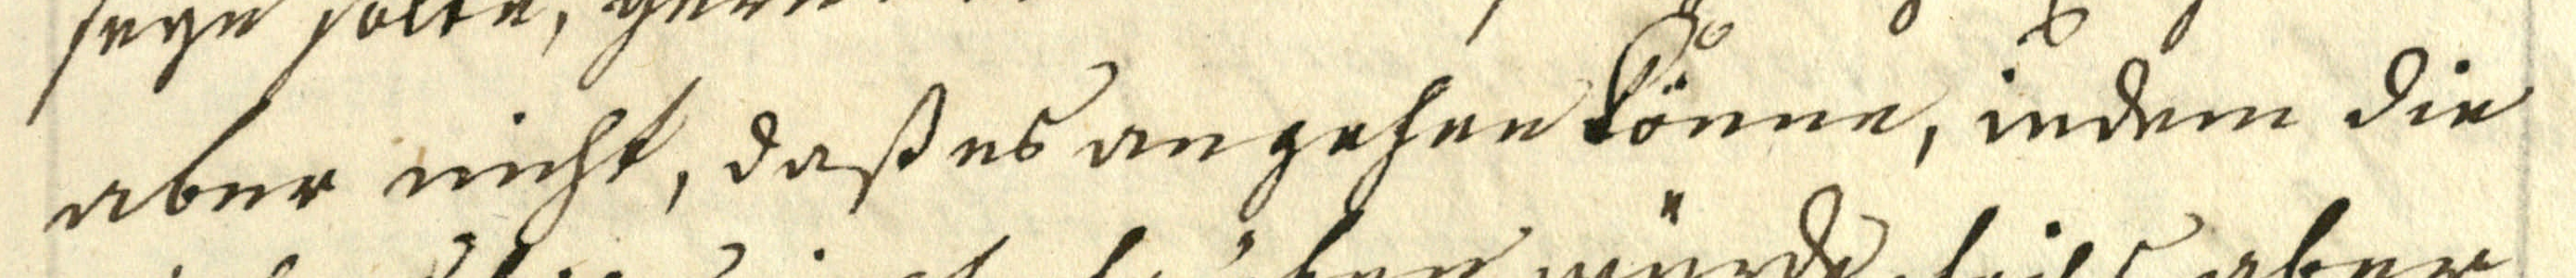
aber nicht, daß es an gehen könne, indem die
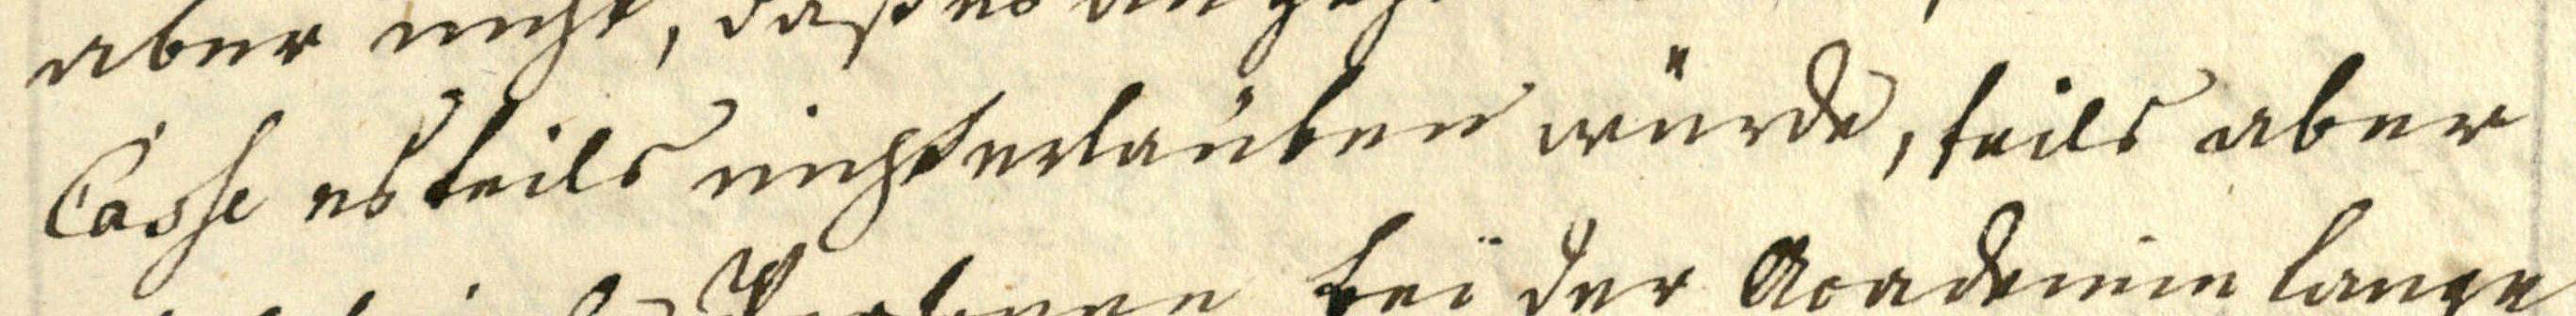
Casse es teils nicht erlauben würde, teils aber
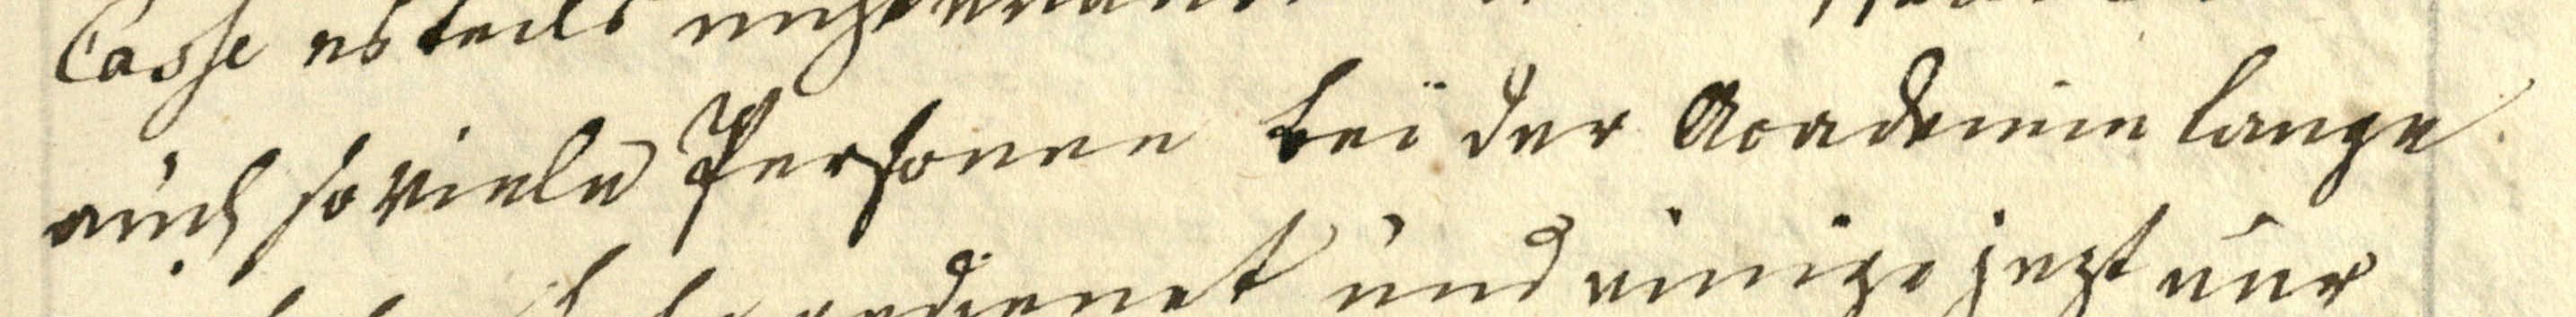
auch so viele Personen bei der Academie lange
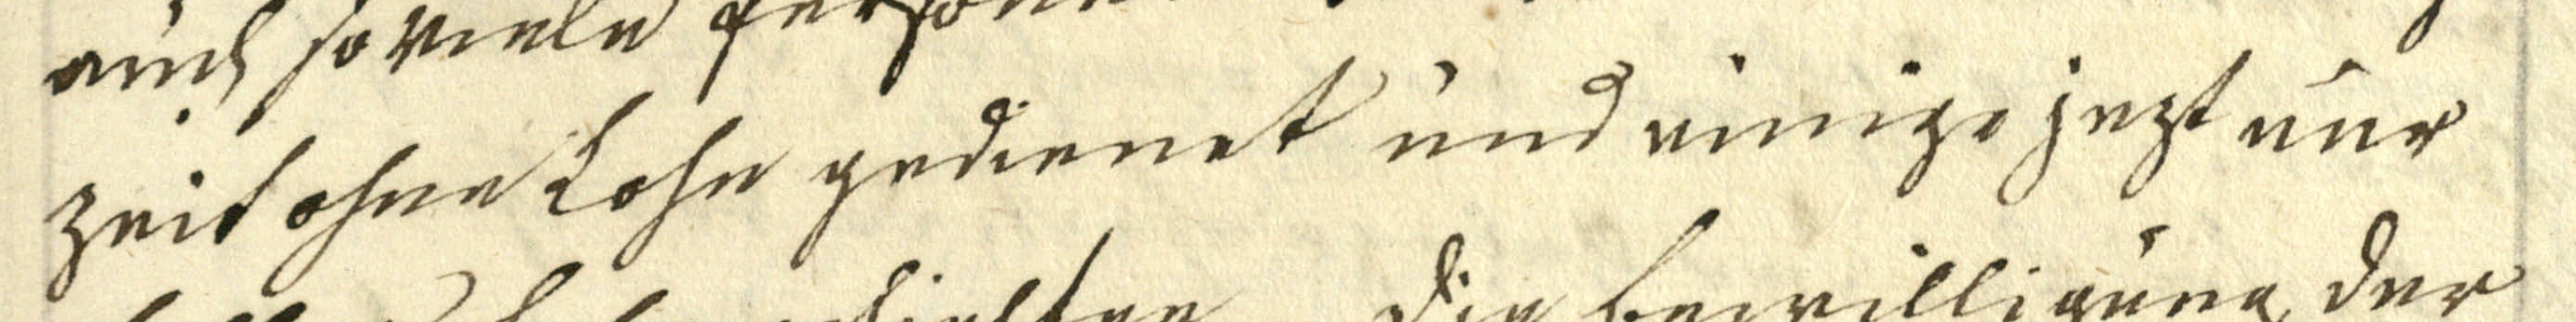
Zeit ohne Lohn gedienet und einige jezt nur
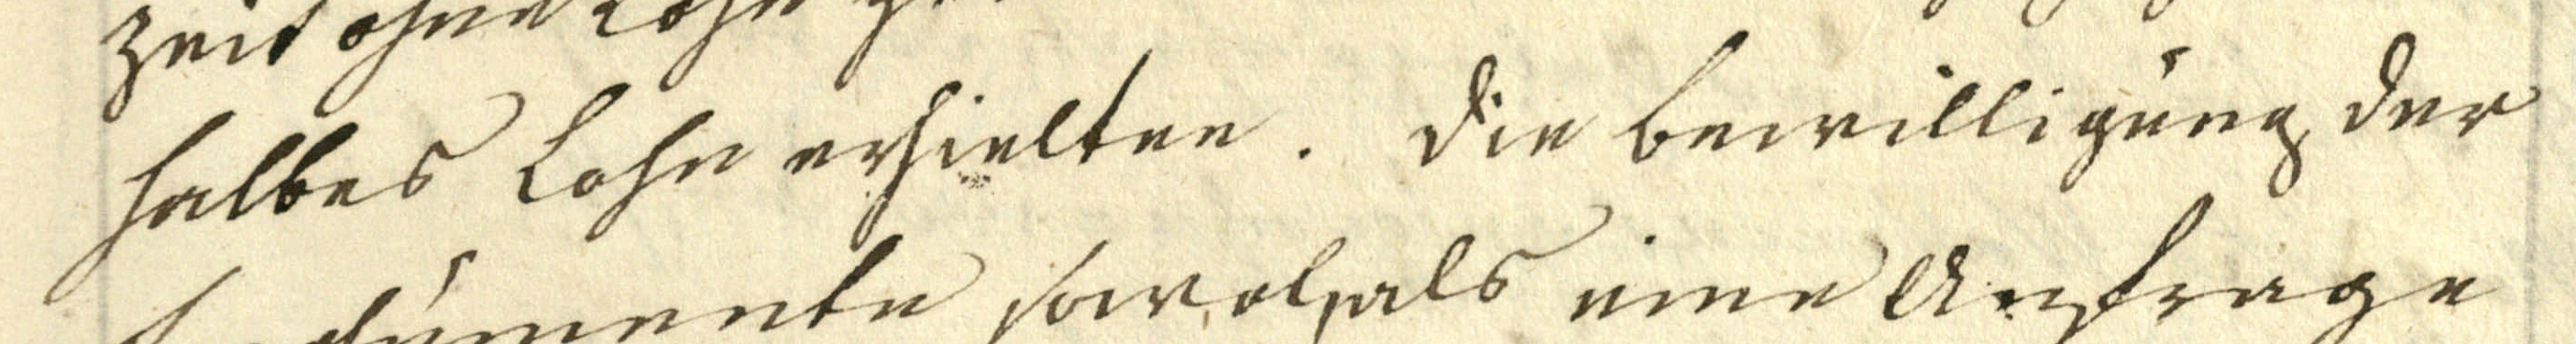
halbes Lohn erhielten. Die Bewilligung der
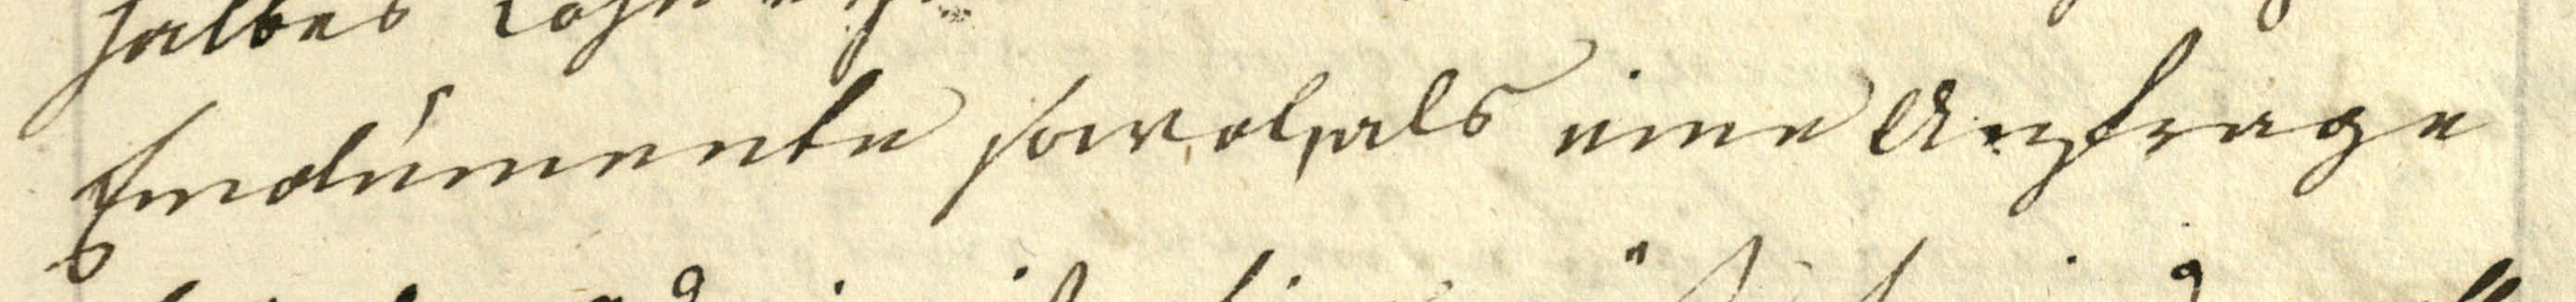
Emolumente sowol, als eine Anfrage
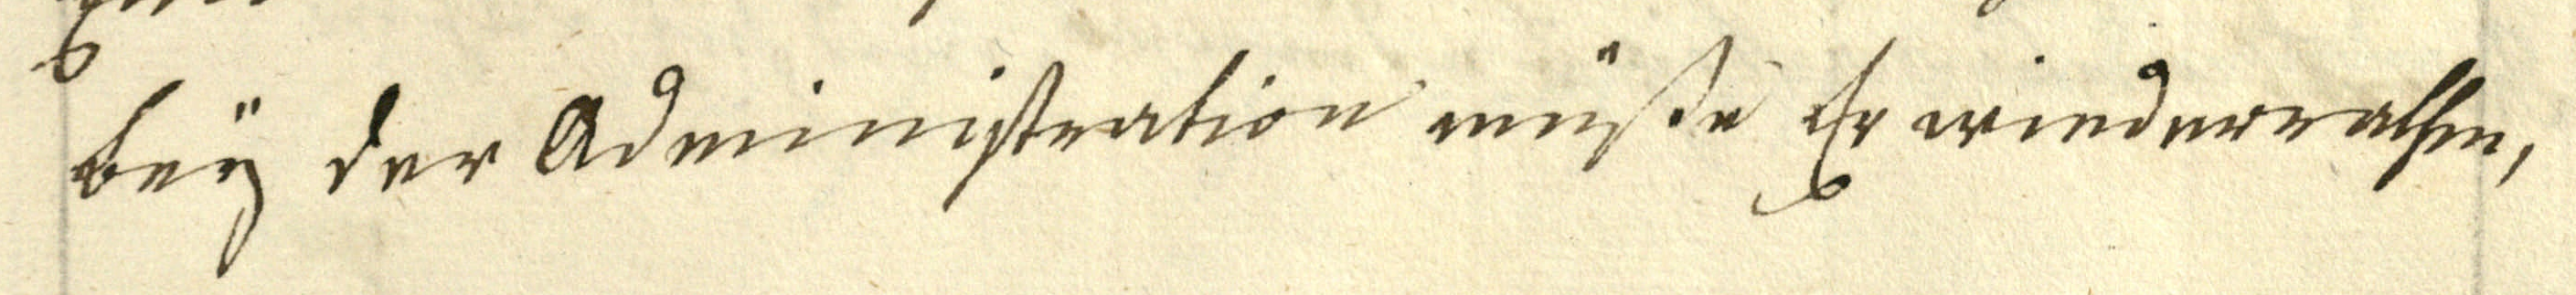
beÿ der Administration müße Er wiederrathen,
